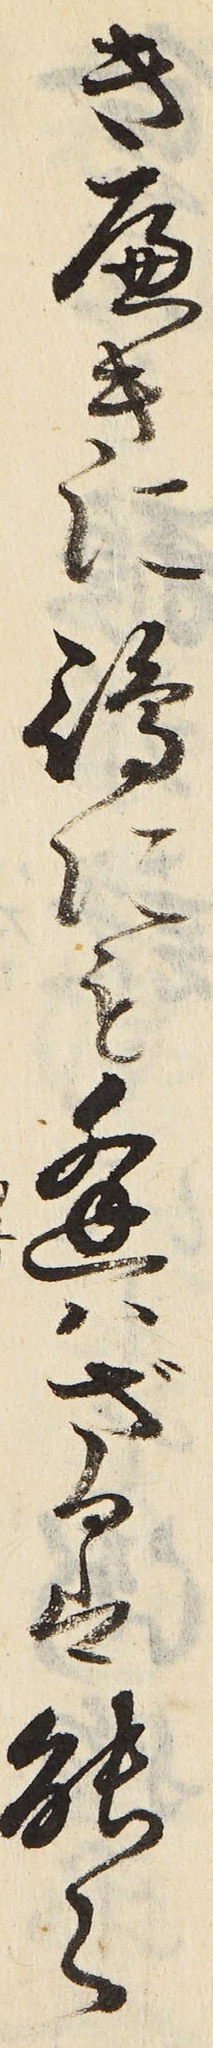きへきに嶋にも逢はざるは能々
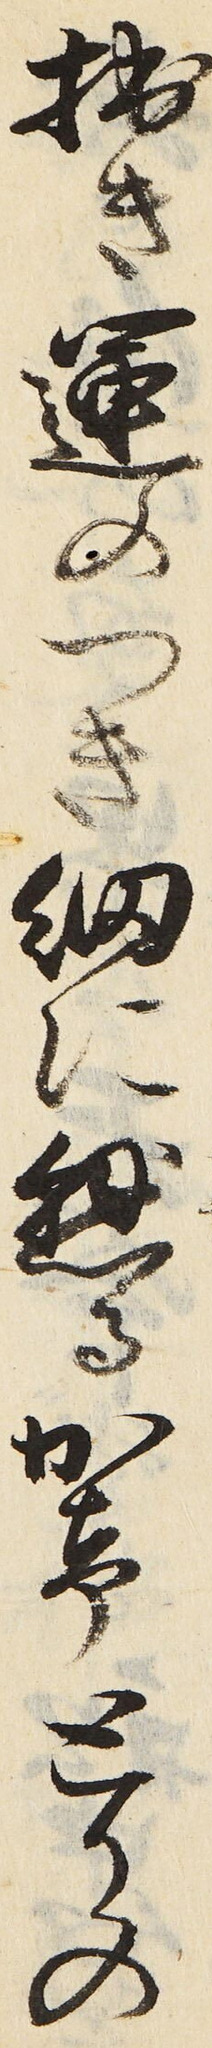拙き運のつき細に懸るかけとりの
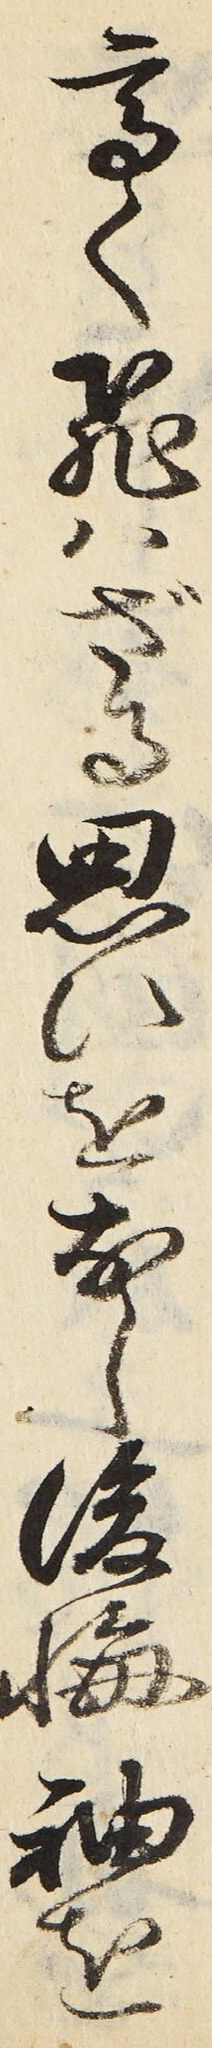高く飛はざる思ひをなし後悔袖を
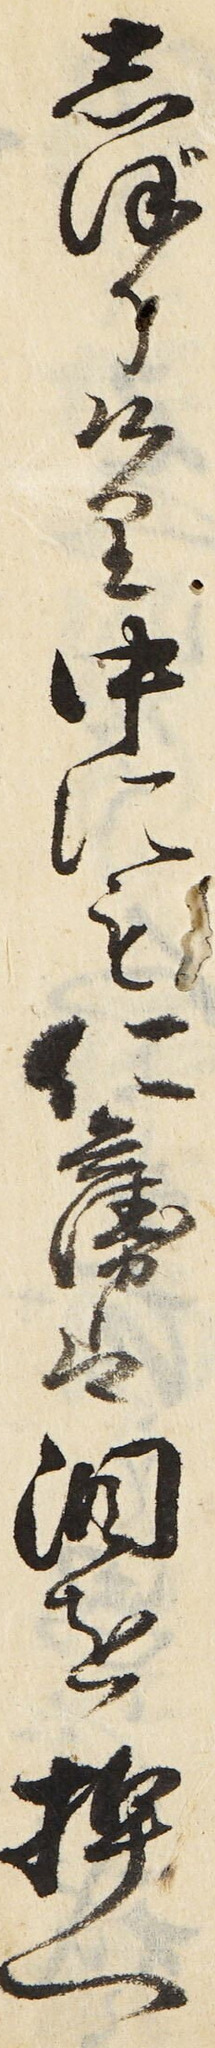しぼりけり中にも仁兵衛は泪を抑へ
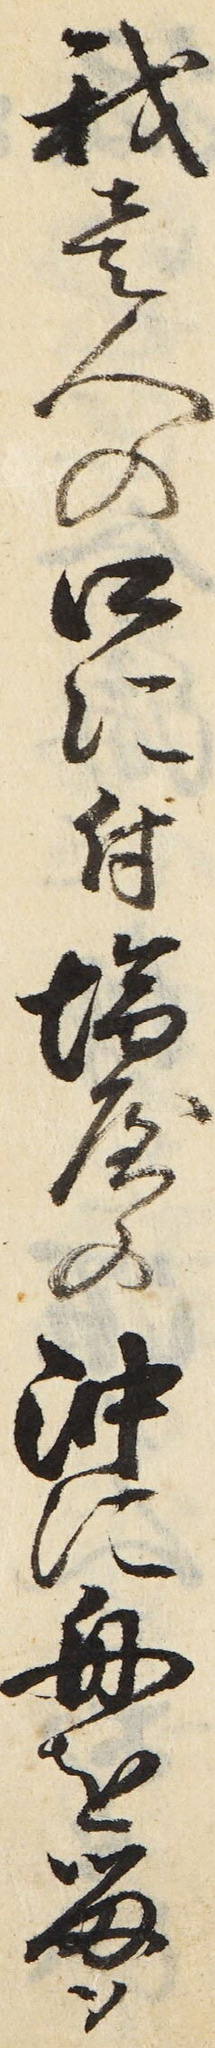我壱人の口に付塩屋の沖に舟を留め
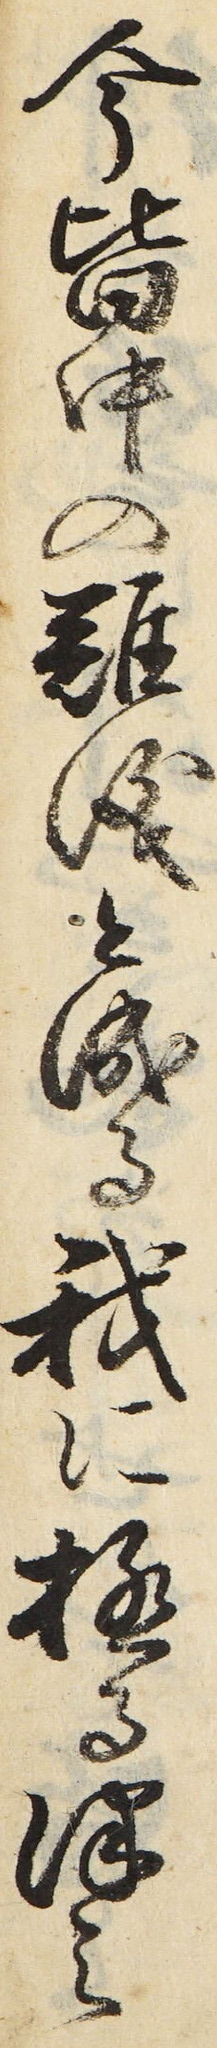今皆中の難儀と成る我に極る津之

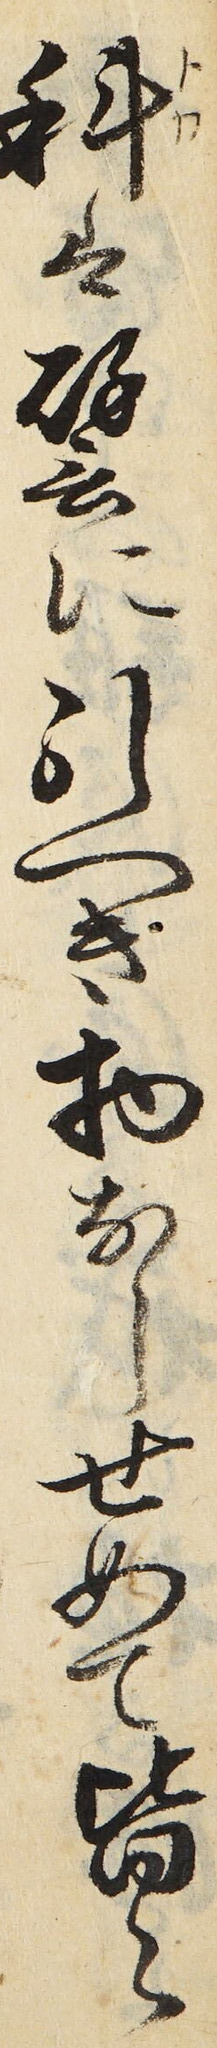科は譬に引へき物なしせめて皆々
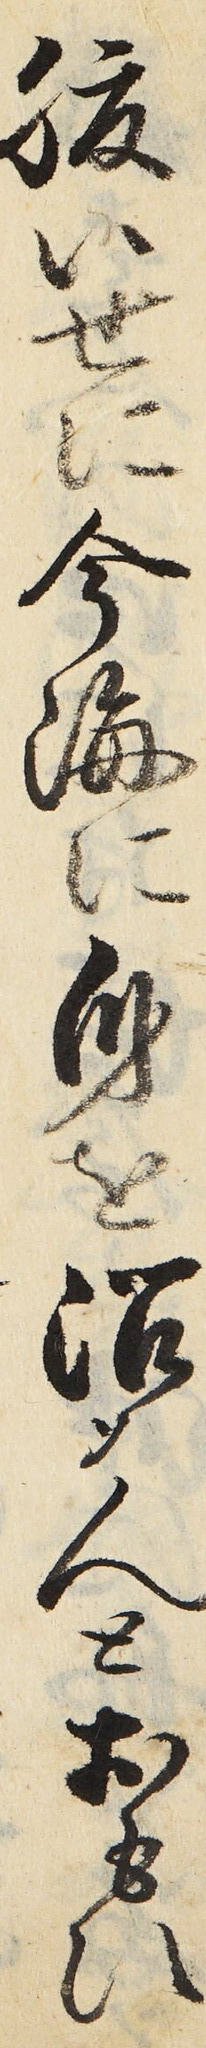腹いせに今海に身を溜めんとおもひ
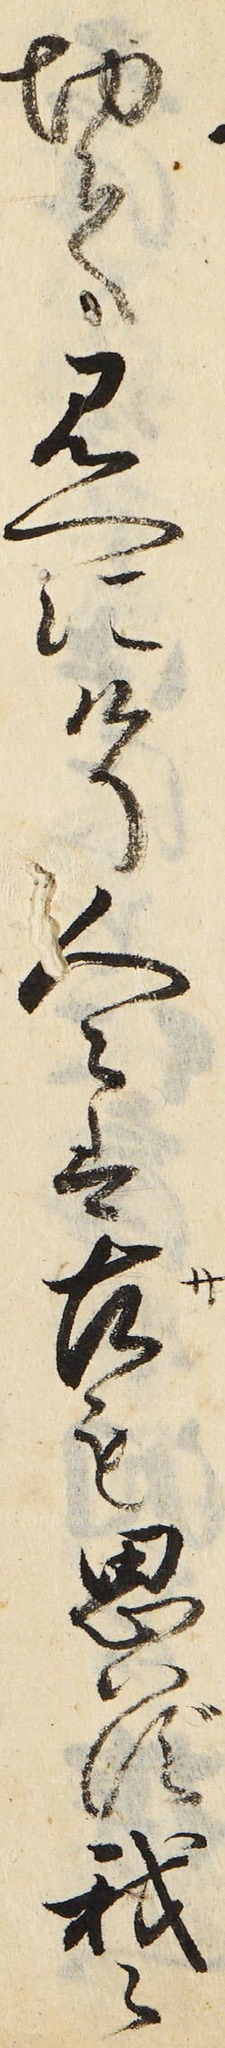切て見へにけり人々はさも思はず我々
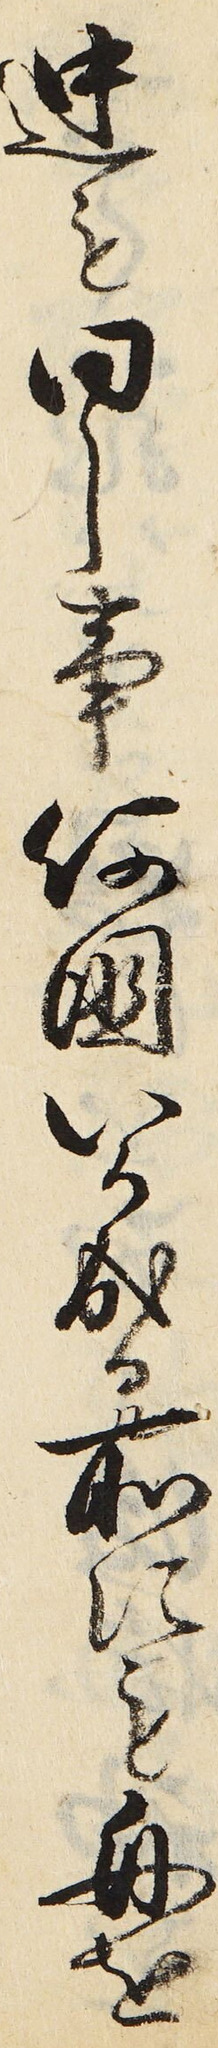迚も同し事何国いか成る所にも舟を
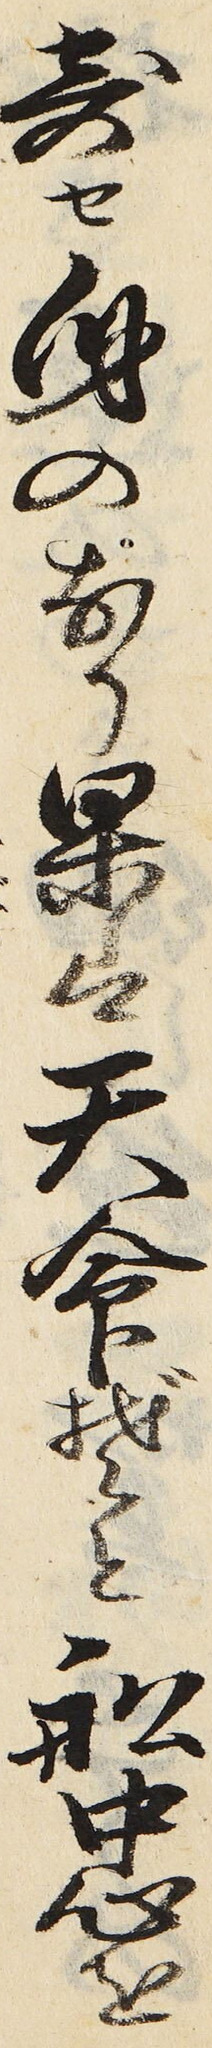寄せ身のなり果は天命ぞと船中心を
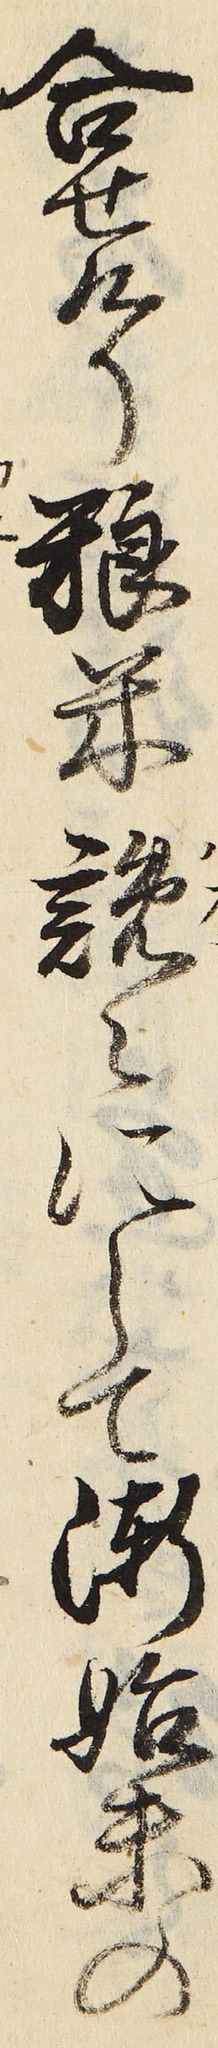合せけり粮米纔々にして漸始末の
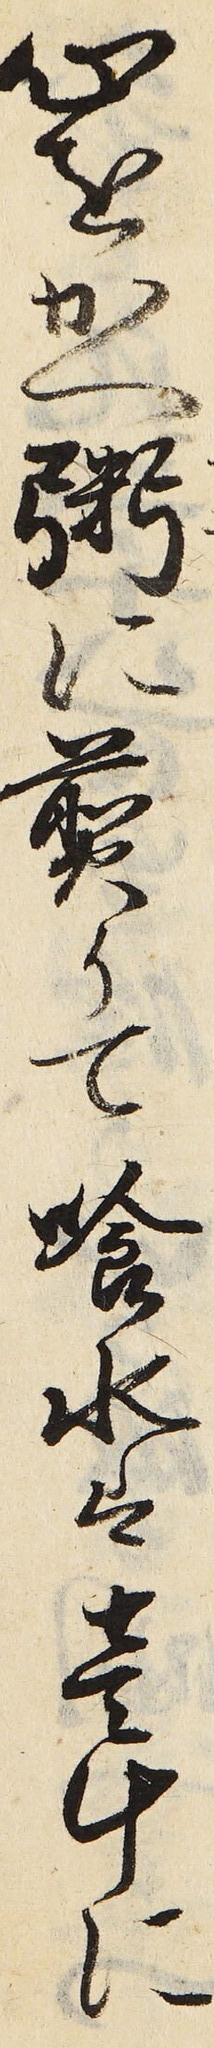心をかへ粥に煎りて喰水は壱斗に
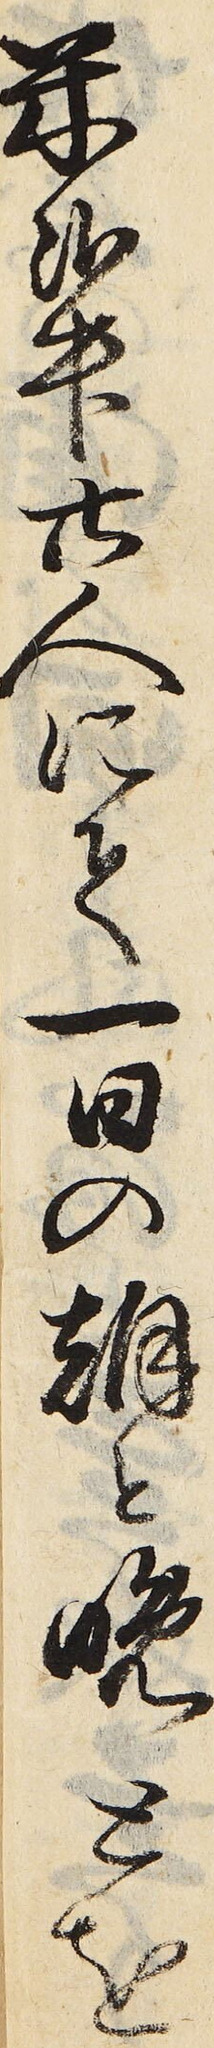米弐升廿人にて一日の朝と晩とを
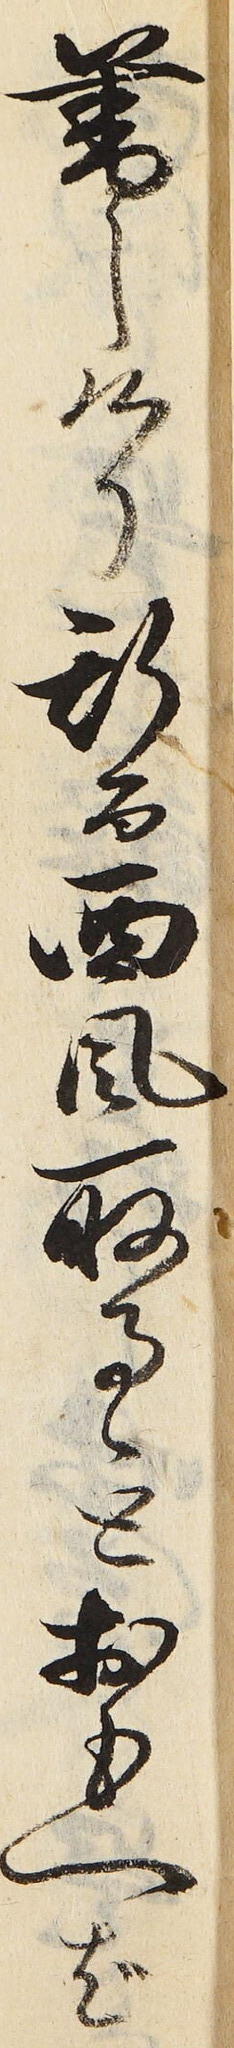暮しけり斯而西風取るゝとおもへば
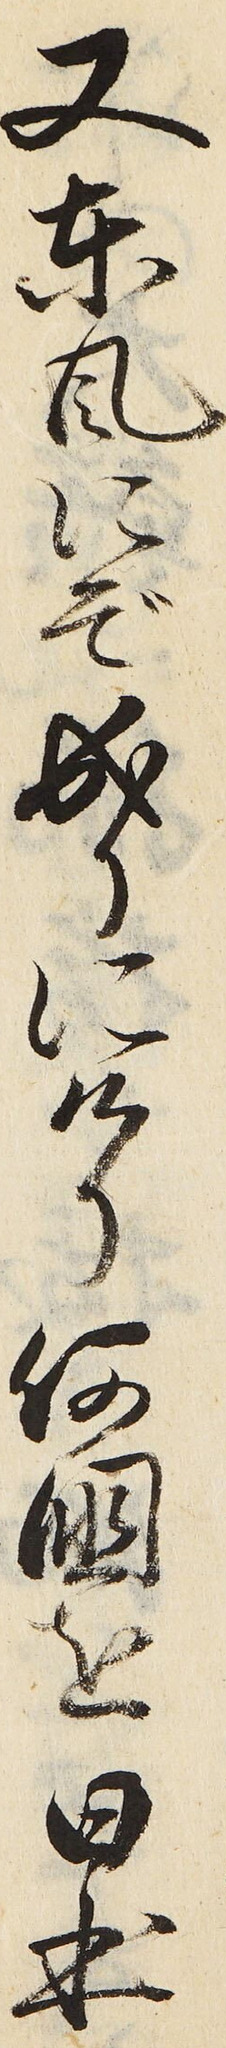又東風にぞ成りにけり何国を日本
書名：華夷九年録
